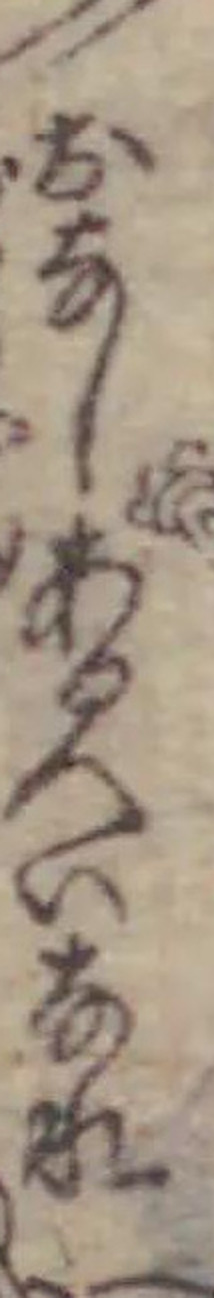おなしあるへいなれ
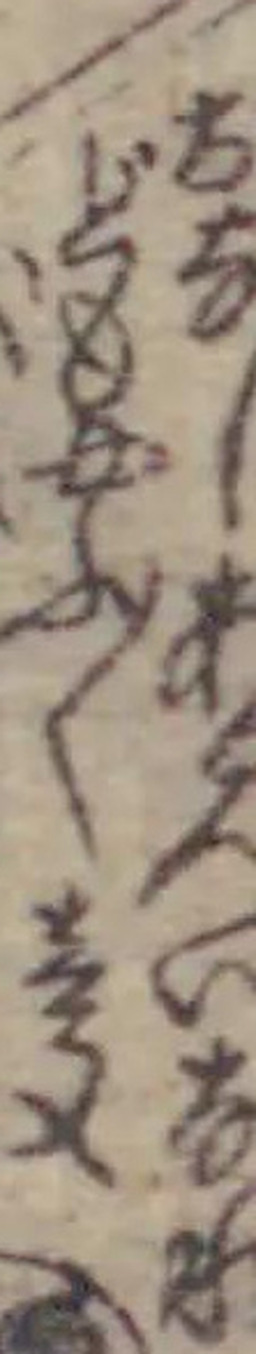どもやふ〳〵壱文
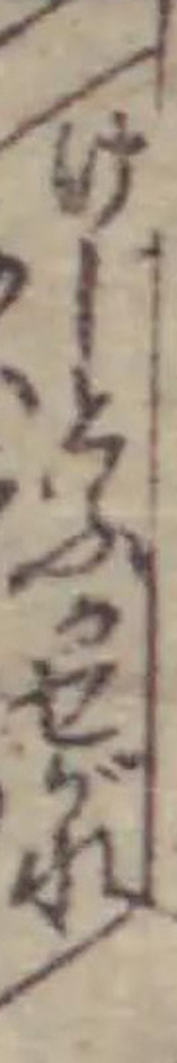けしとふかせがれ
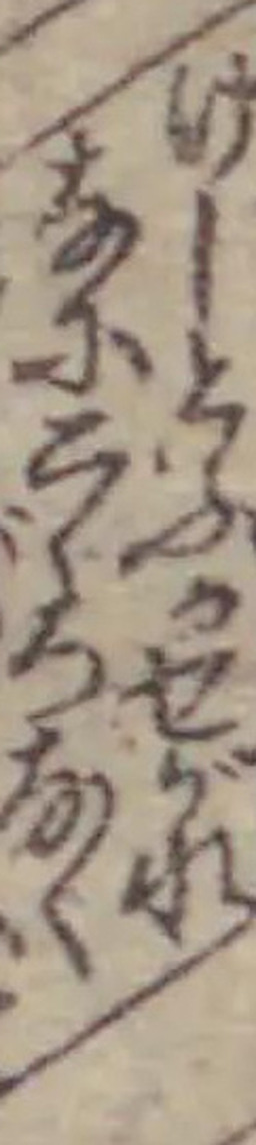なにこゝろなく
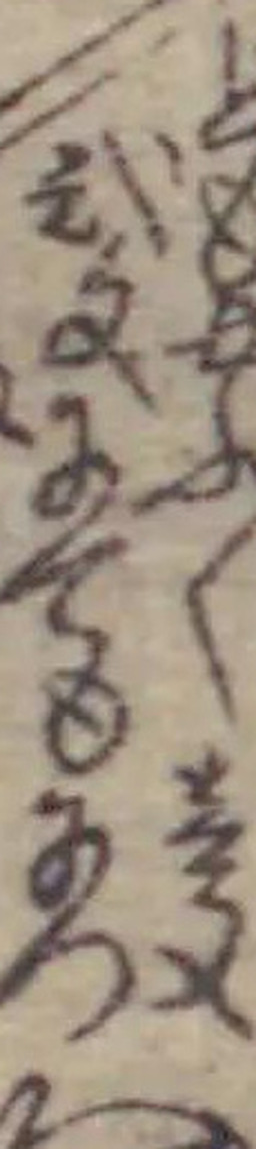弐文にてもにつ
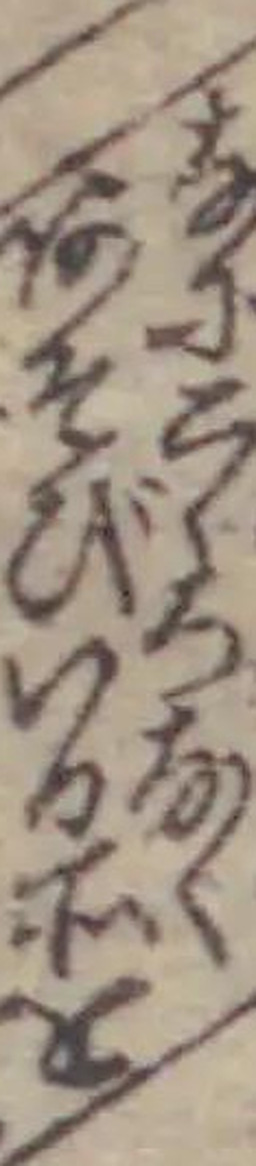あそびいる所を
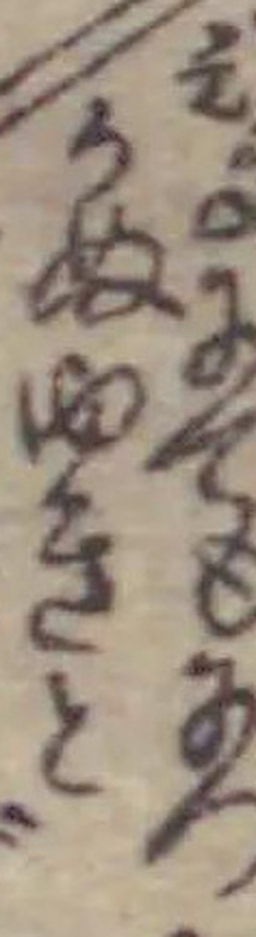かぬゆきと
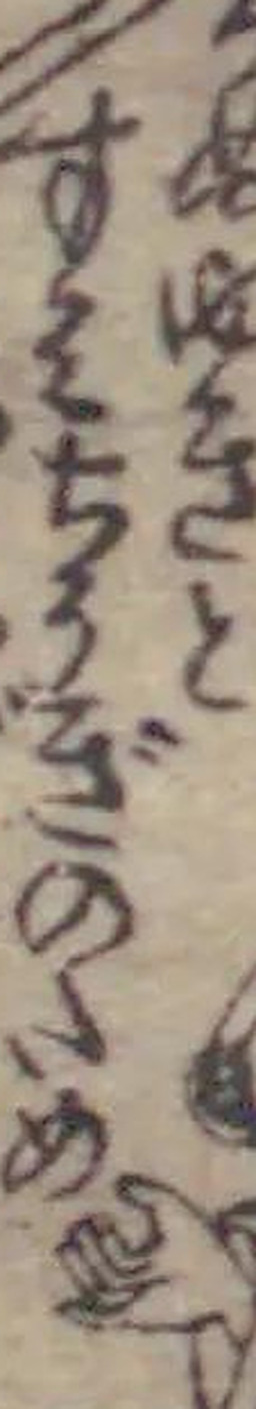すみちうぎのため
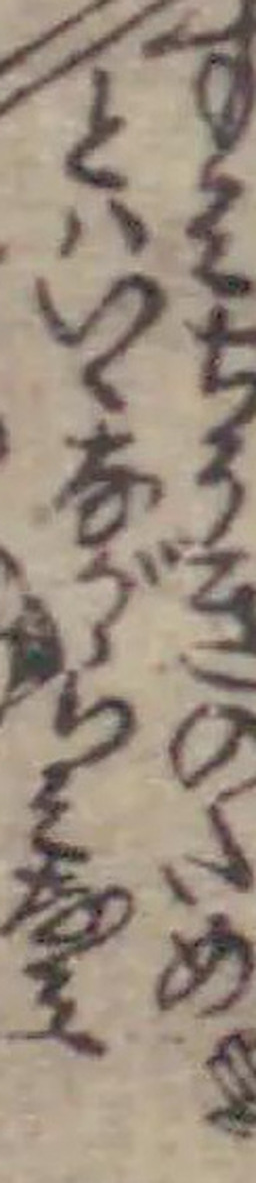とはいゝながらみなみ
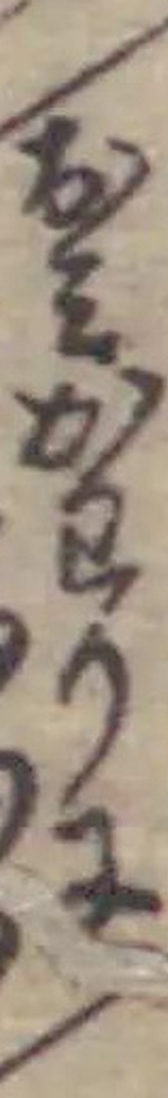おみかわりに
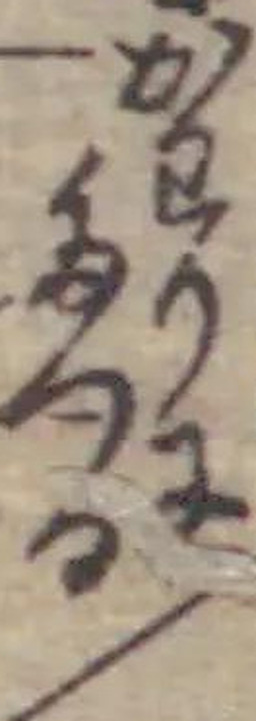たつる
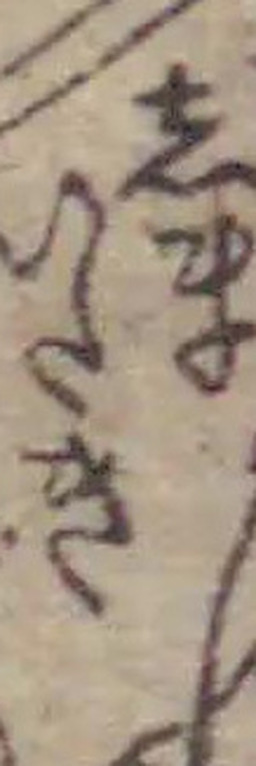いたき
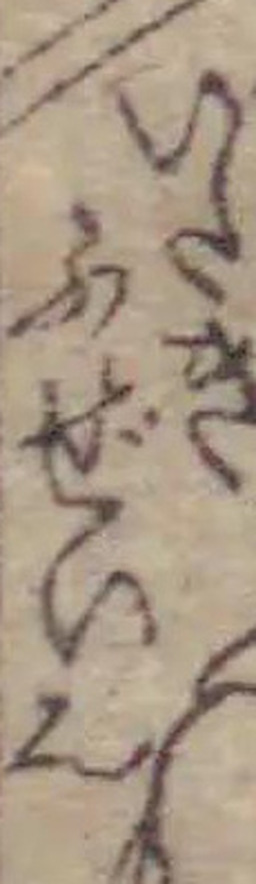ふぜい也

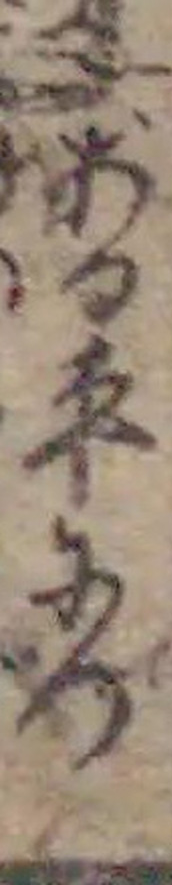ある平につ
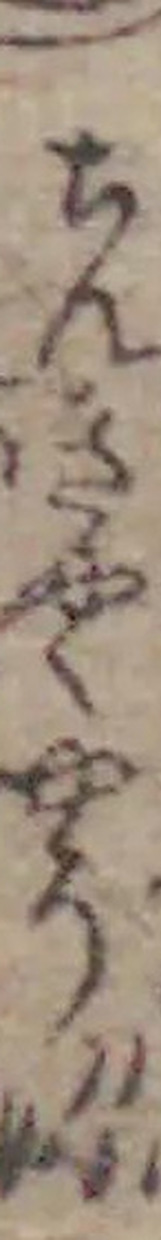ちんきやくやう
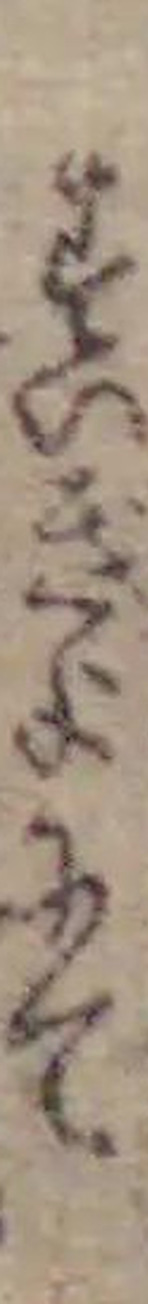すいぎよにて
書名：名代干菓子山殿 3巻
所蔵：国立国会図書館 National Diet Library, JAPAN
